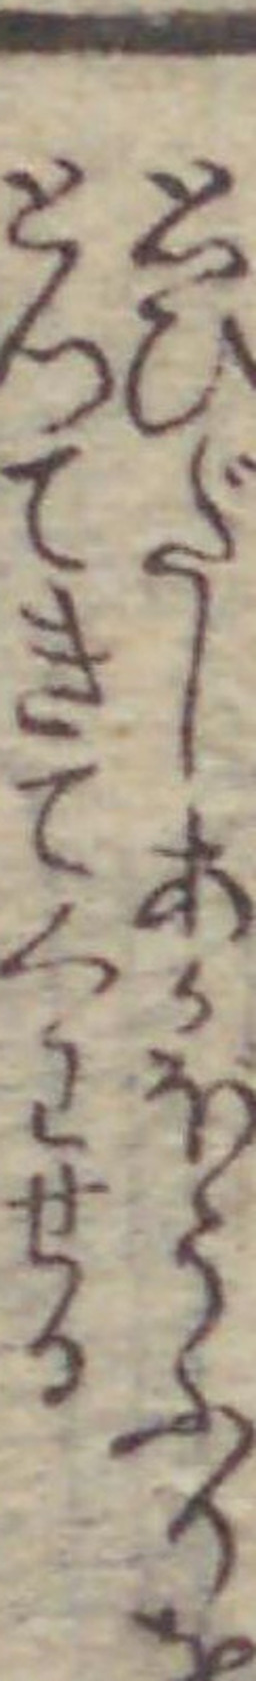とつてきてくわせる
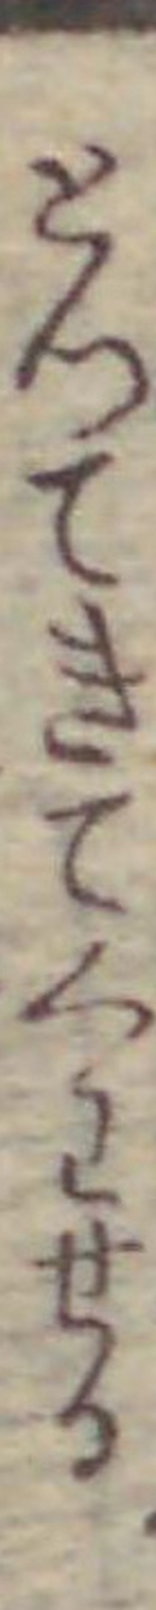とつてきてくわせる
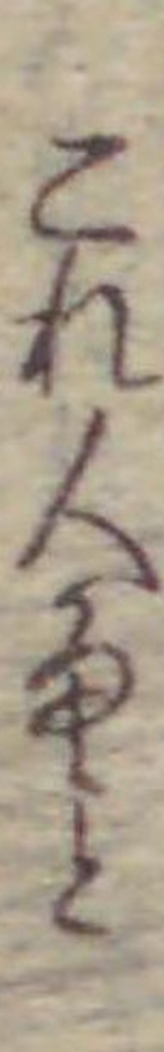これ人魚と
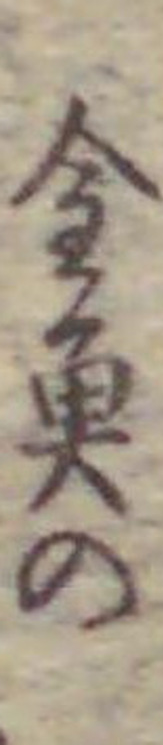金魚の
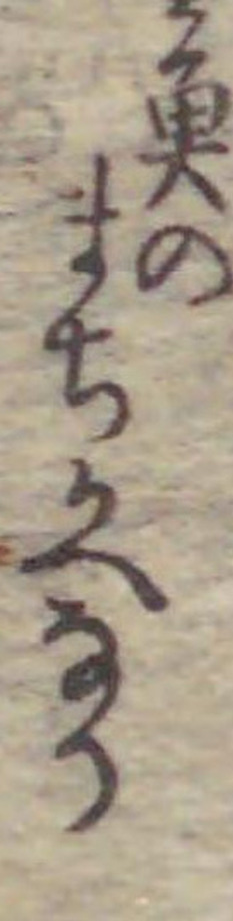まちかへなり

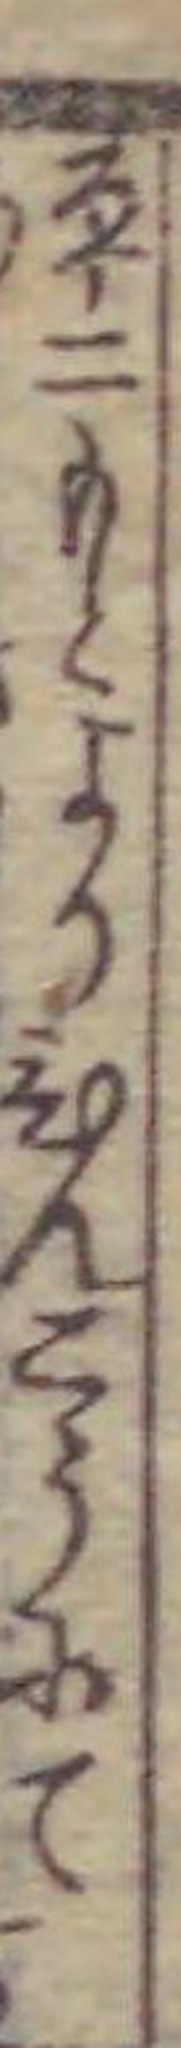平二もとよりひんこうにて
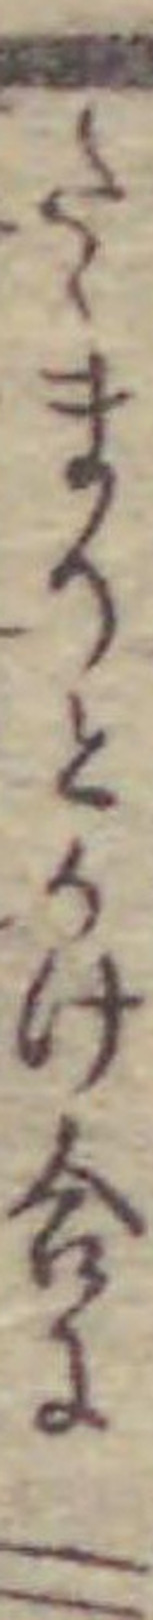たゝまりとかけ合に
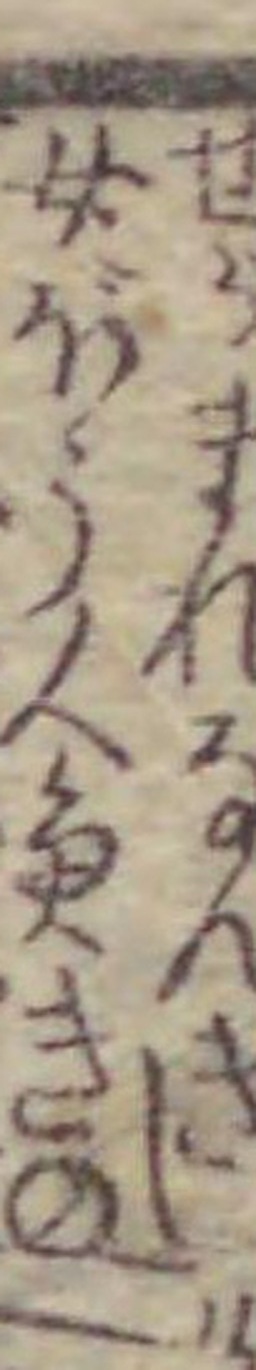女ぼう人魚きの
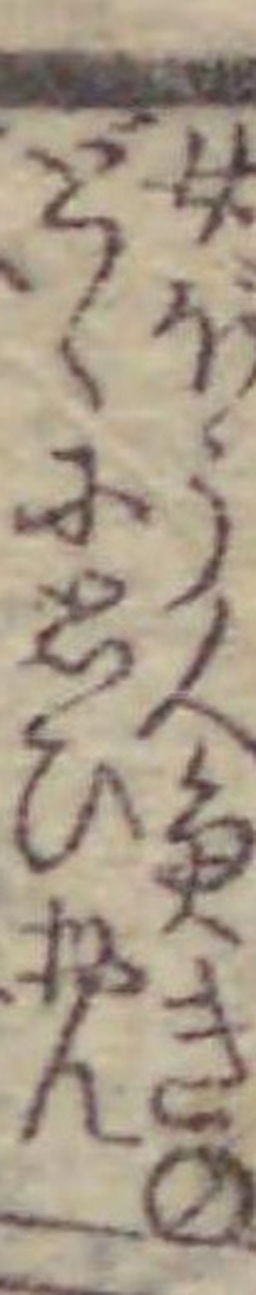どくに思ひおん
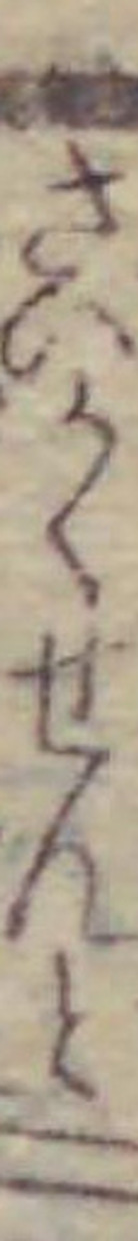さいかくせんと
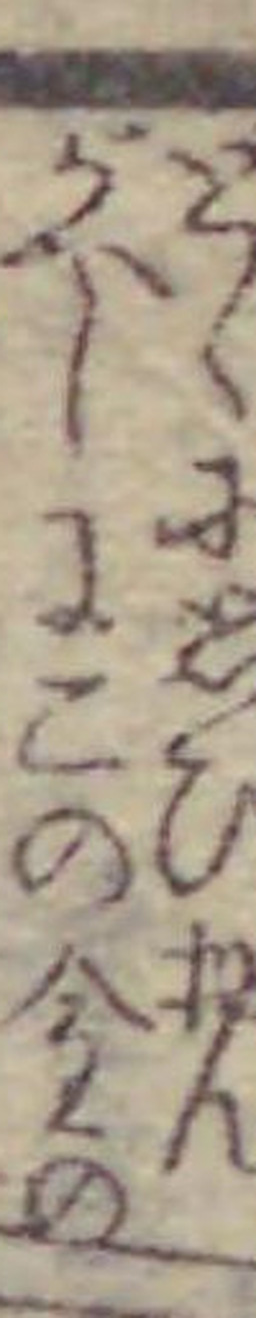がへしにこの金の
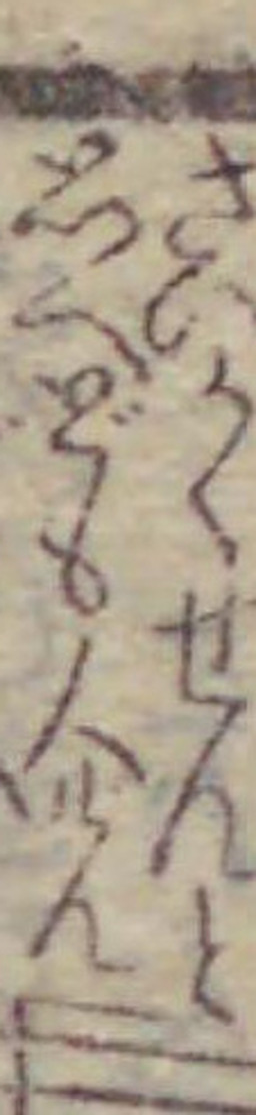思へども人けん
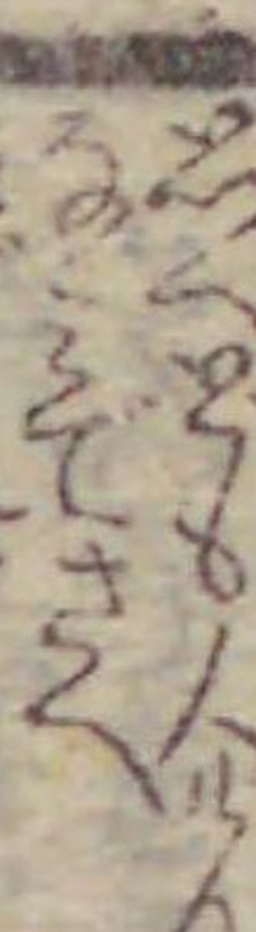なみでさへ
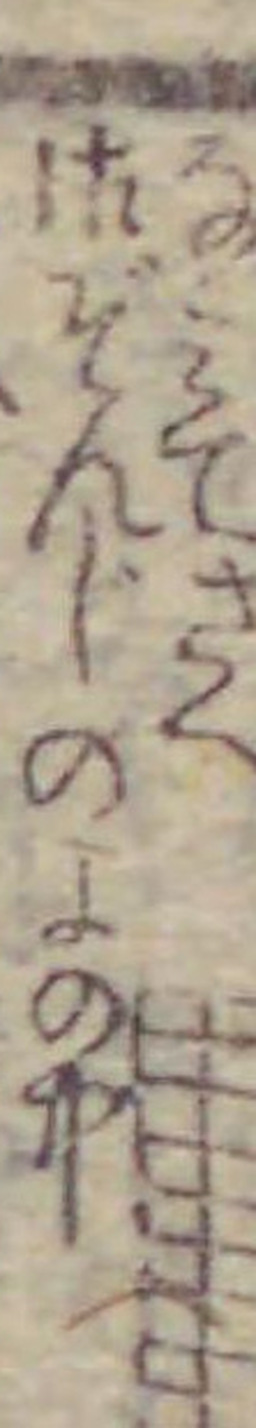御ぞんじのよの中
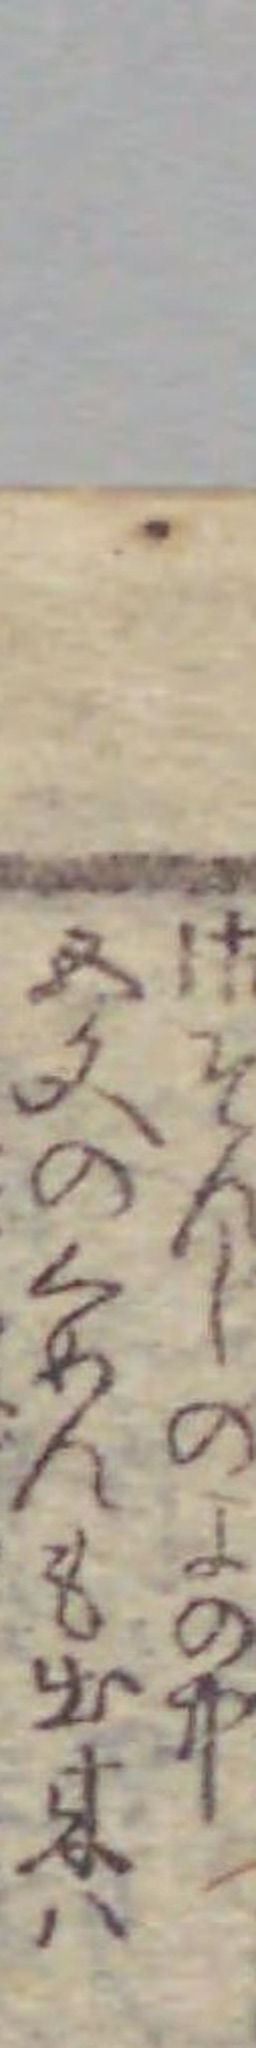五文のくめんも出来は
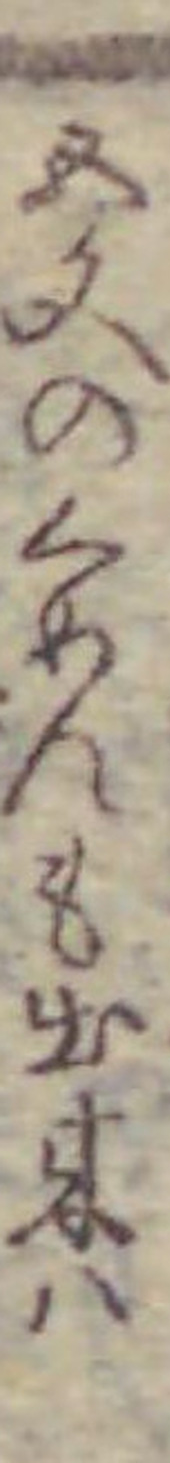五文のくめんも出来は
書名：箱入娘面屋人魚 3巻
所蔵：国立国会図書館 National Diet Library, JAPAN
